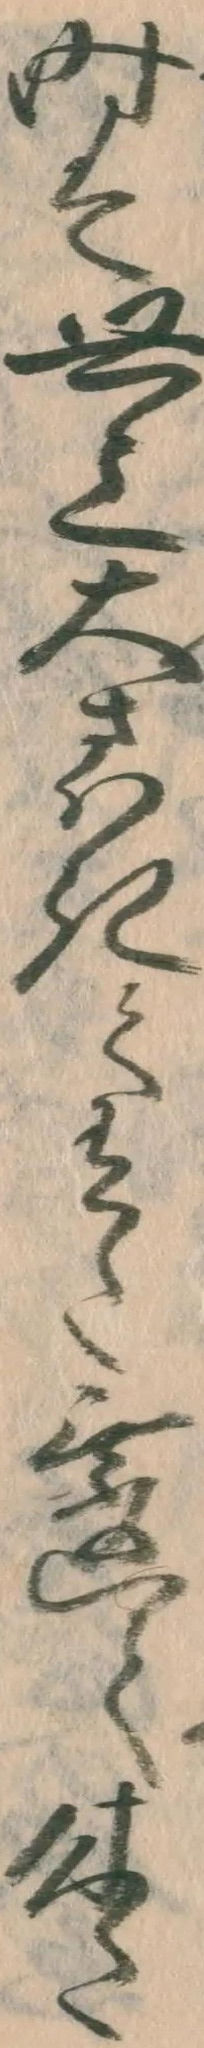時は世上大さハきて有た乗込て来た
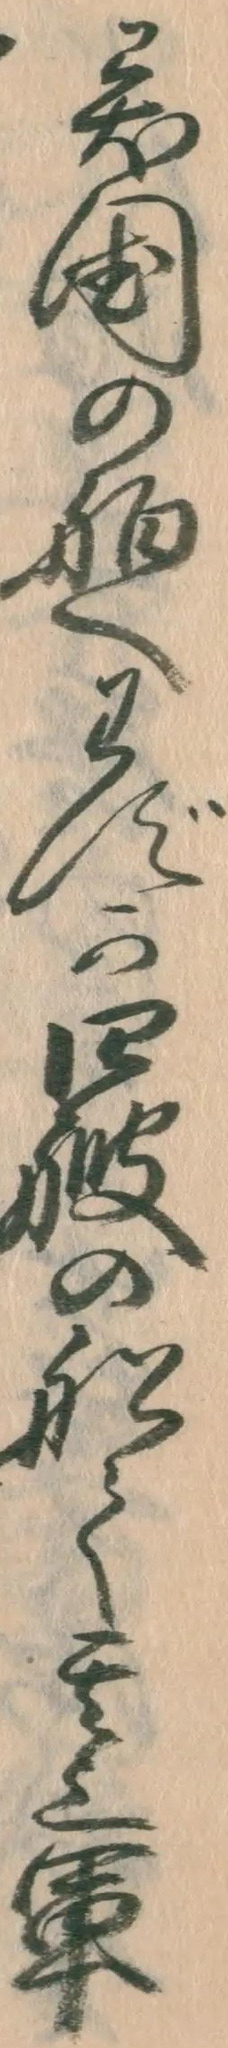異国の舶へわずか四艘の船て其上軍
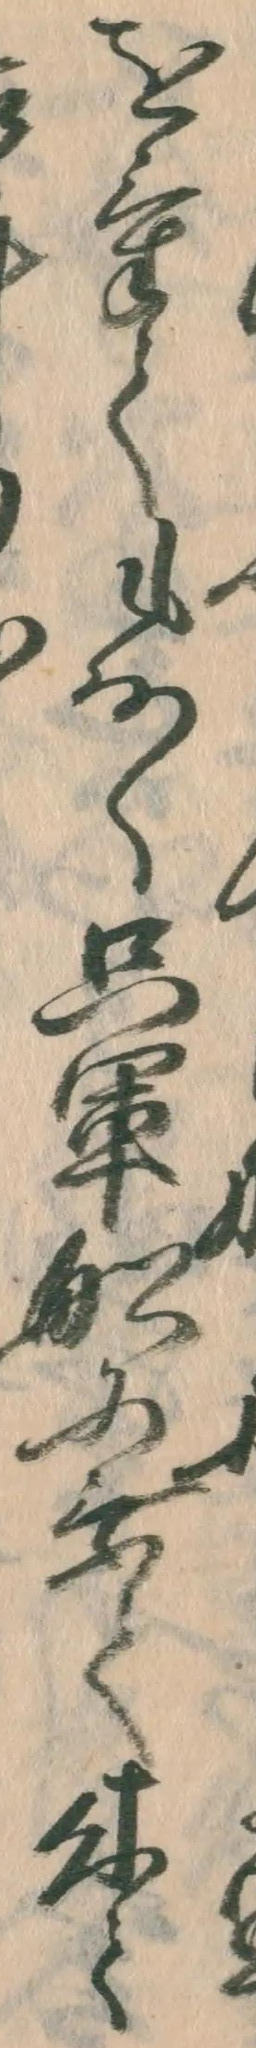を氣てもなく只軍船に乗て来て
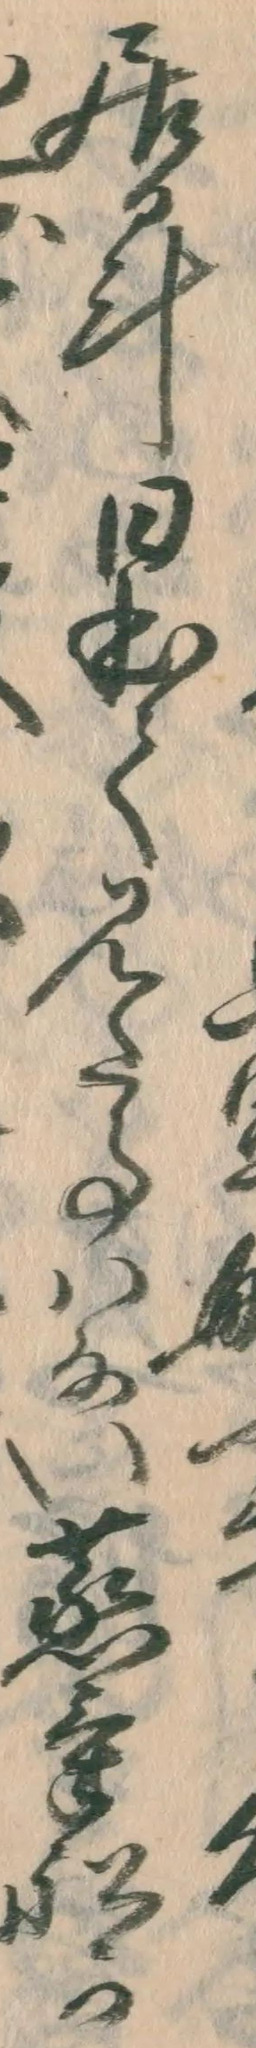居る斗日本て見た事ハない蒸気船か
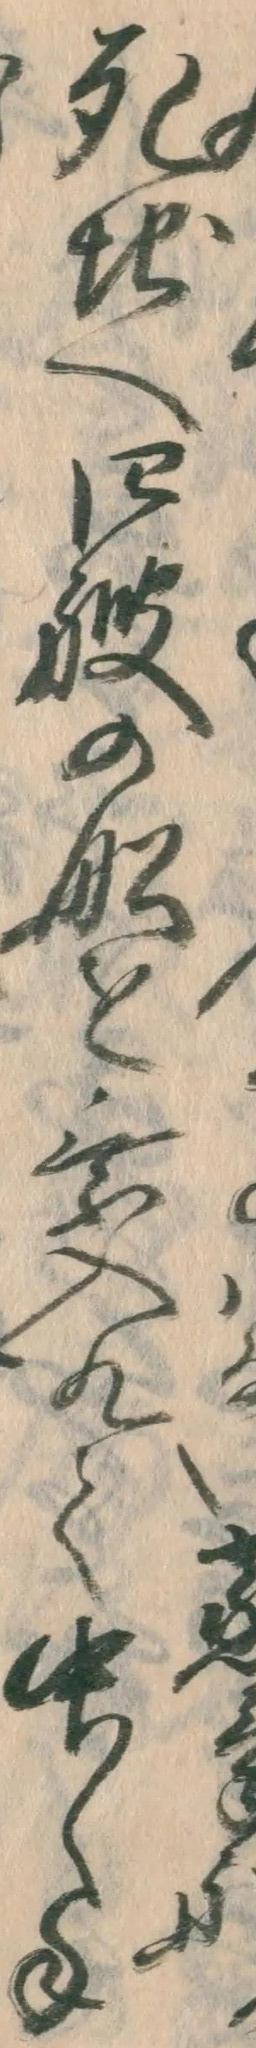死地へ四艘の船を乗入れて中〳〵手
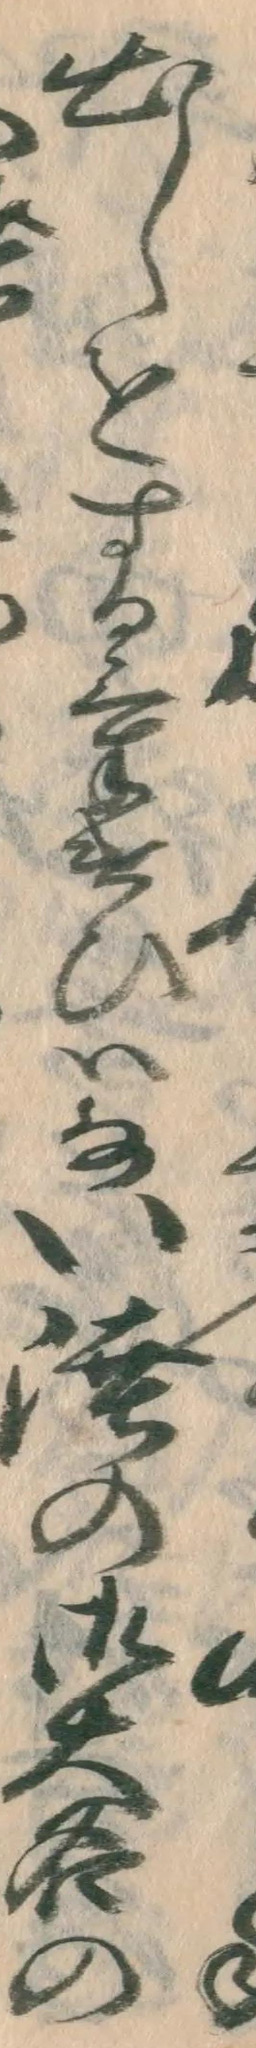出しをする氣遣ひハない陸の御大名の
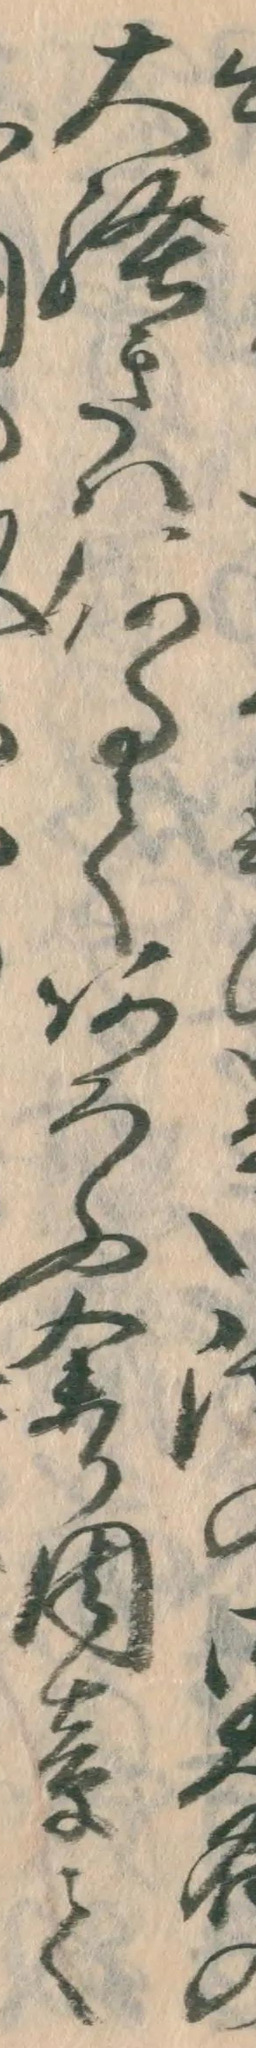大騒きハ何事てあろふ余り周章て
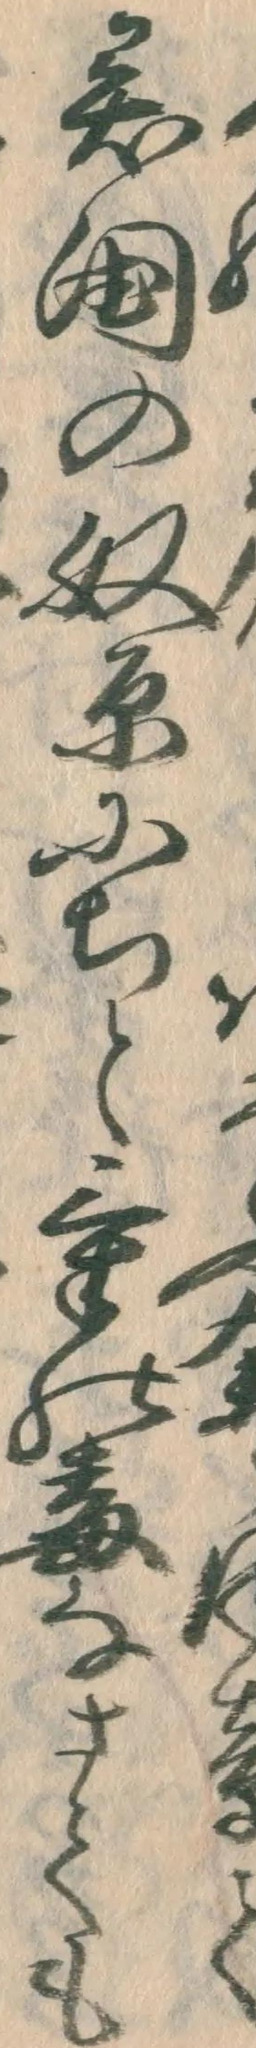異国の奴原にちと氣の毒なさても
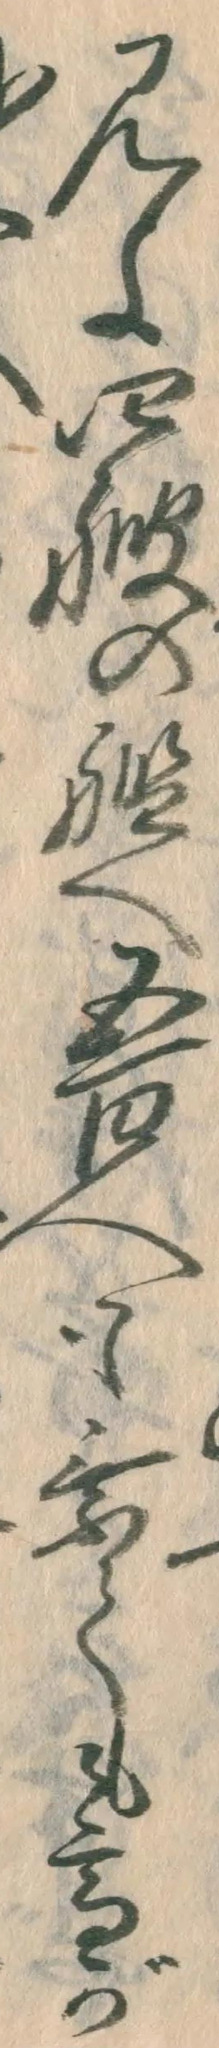見よ四艘の艦へ五百人も乗ても高が
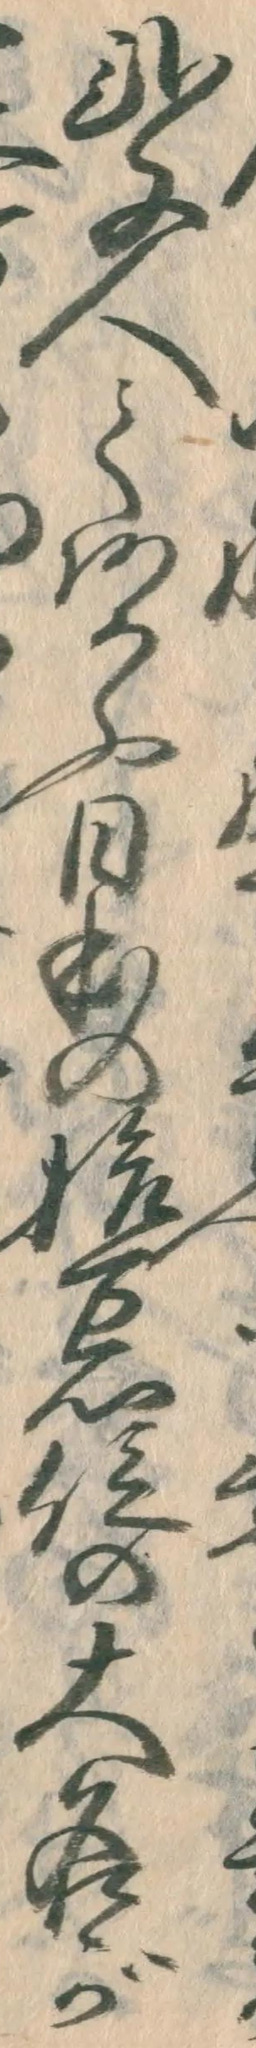弐千人てあろふ日本の拾万石位の大名が
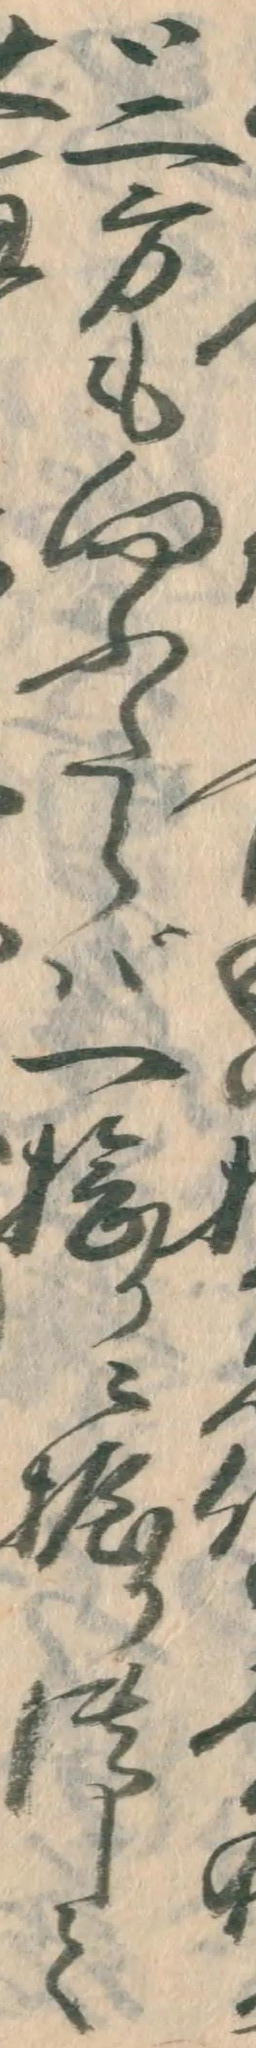御二方も向ふたらバ一捻りニ捻り潰して
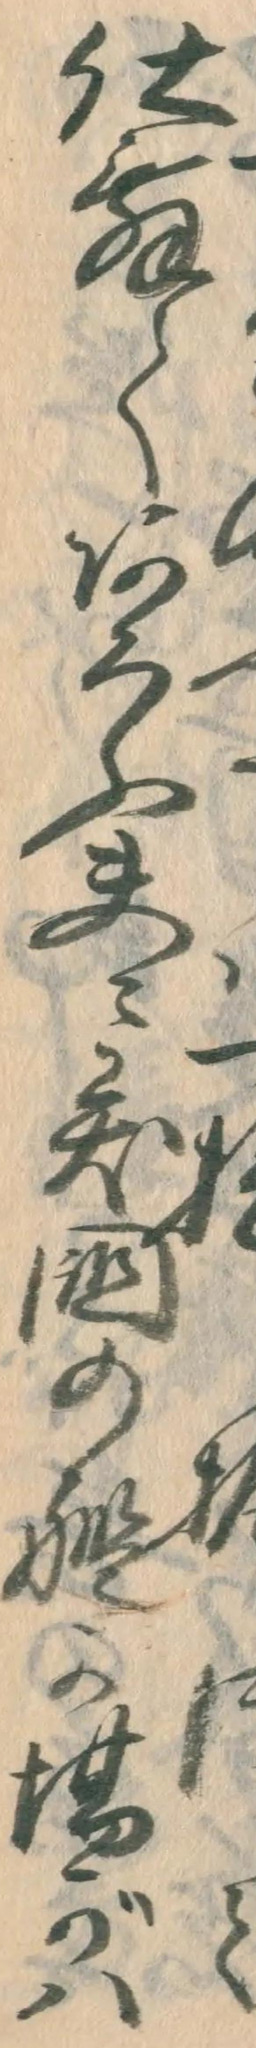仕舞てあろふ夫々異国の艦か場がハ

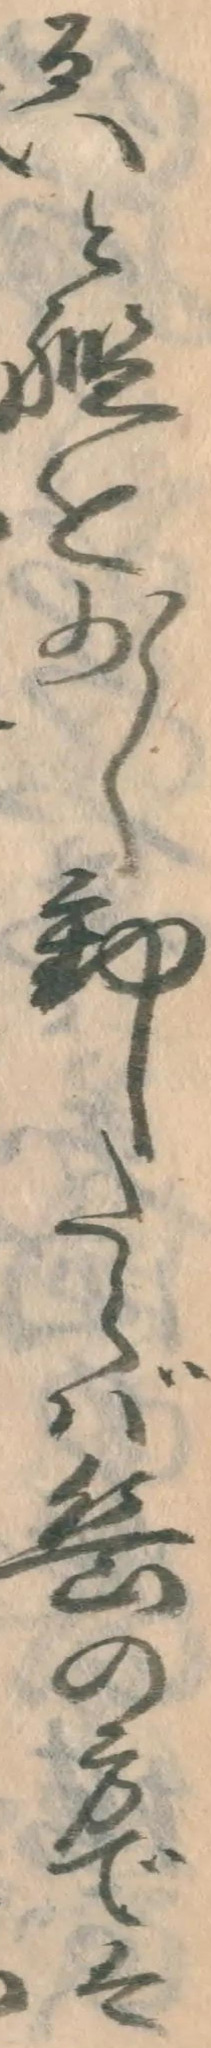るいと艦を少し動したらバ岳の方では
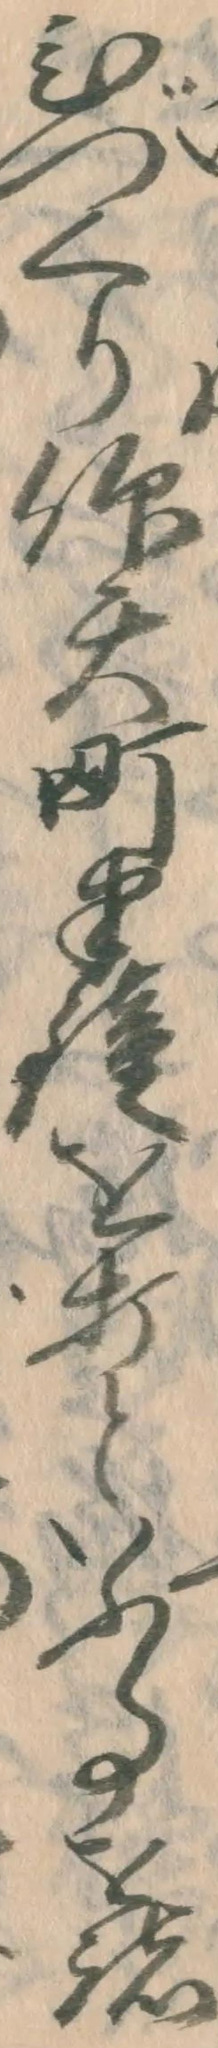びつくり仰天町半鐘を打といふ事を諸
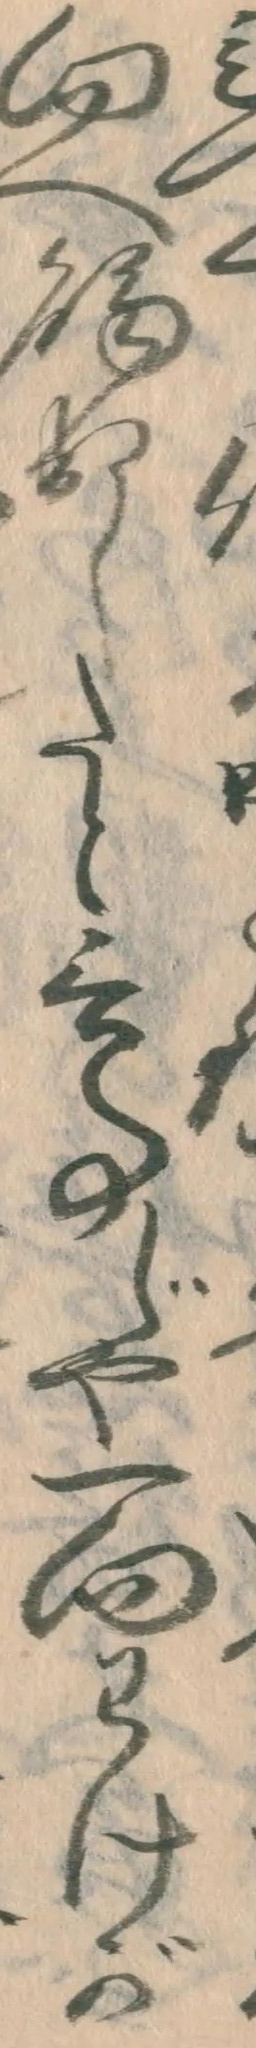向へ觸出したと云事じゃ一向わけが
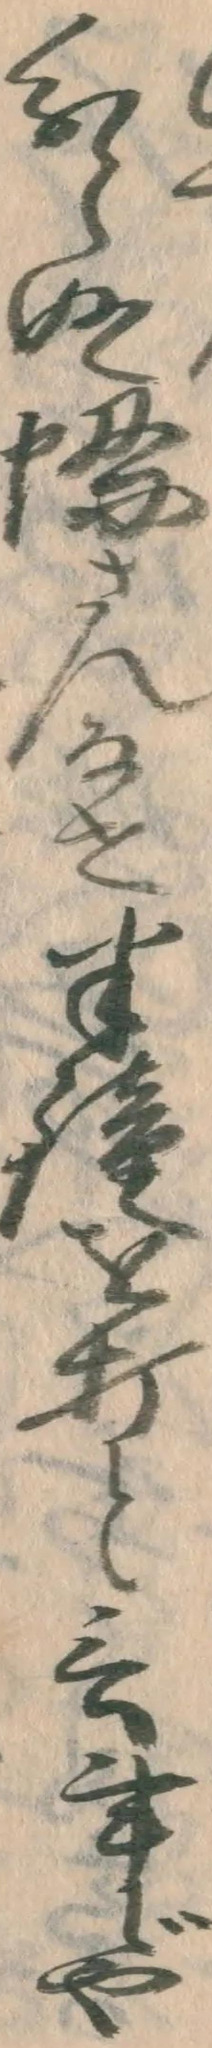分らぬ螺さんなせ半鐘を打と云事じや
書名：麗斎叢書. 20
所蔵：国立国会図書館 National Diet Library, JAPAN
